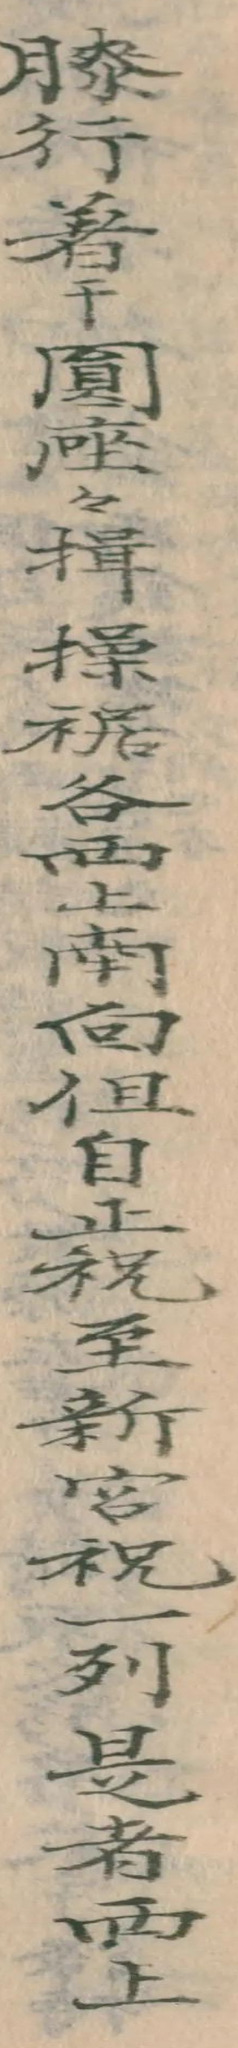膝行着于円座々揖操裾各西上南向但自正祝至新宮祝一列是者西上
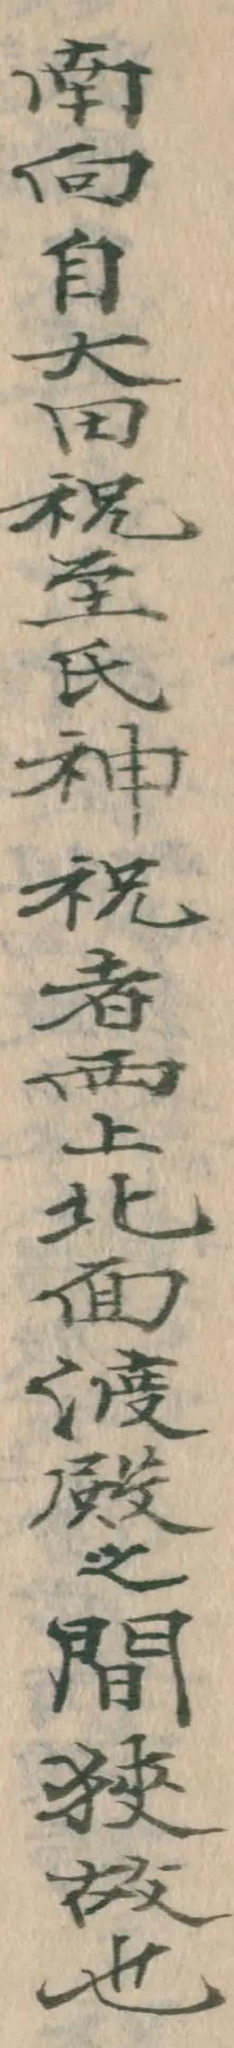南向自大田祝至氏神祝者西上北面渡殿之間狭故也
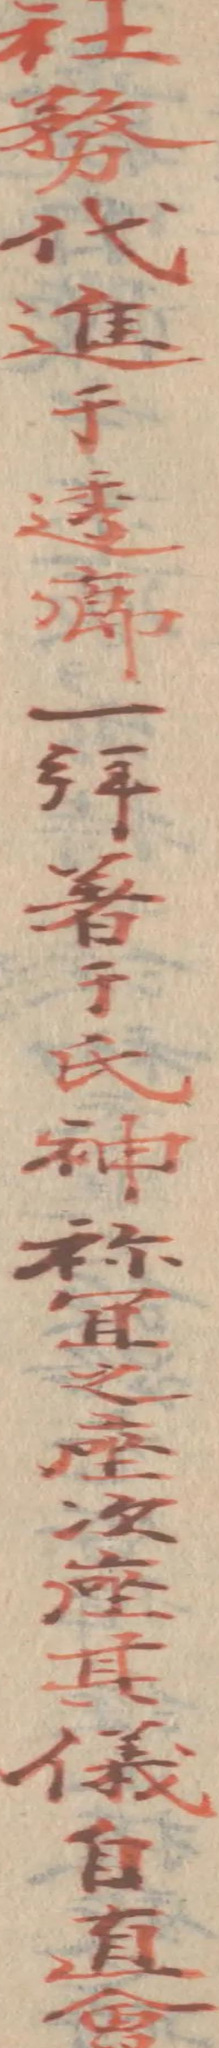社務代進于透廊一拝着于氏神称宜之座次座其儀自直会
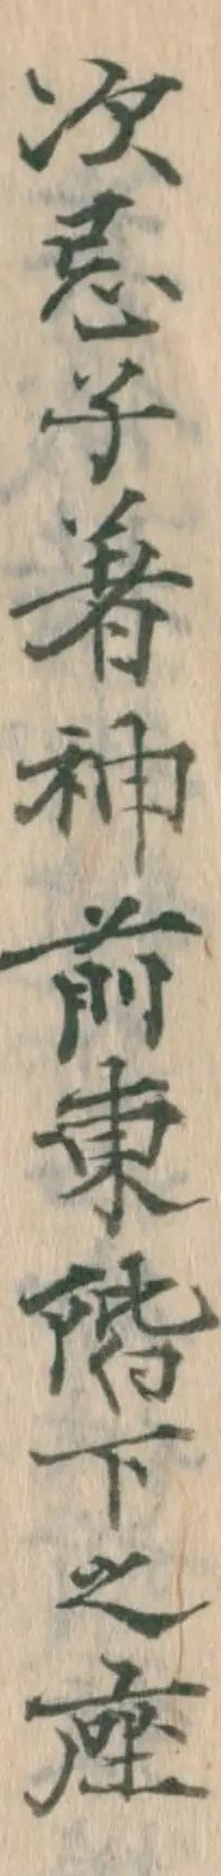次忌子着神前東階下之座
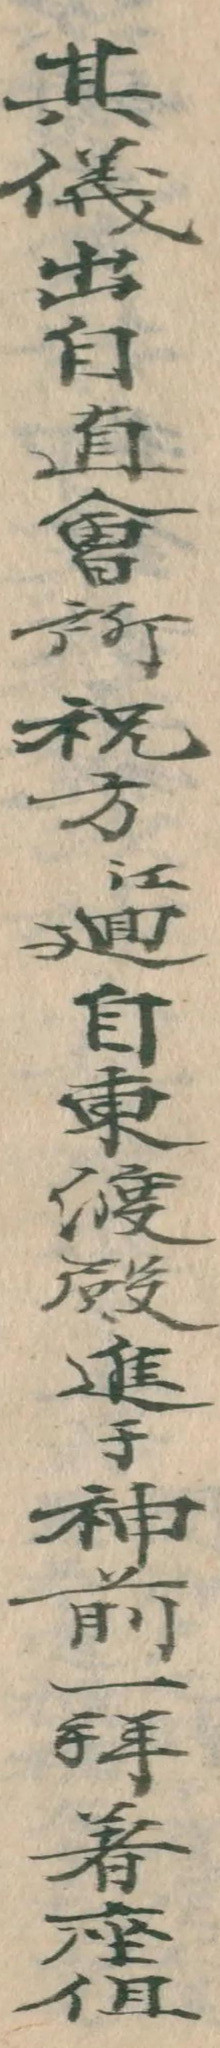其儀出自直会所祝方江廻自東渡殿進于神前一拝着座但
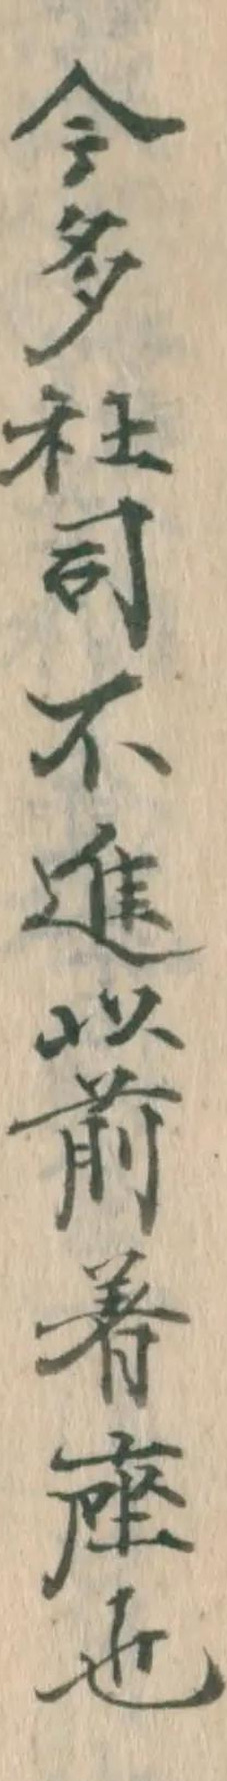今多社司不進以前着座也
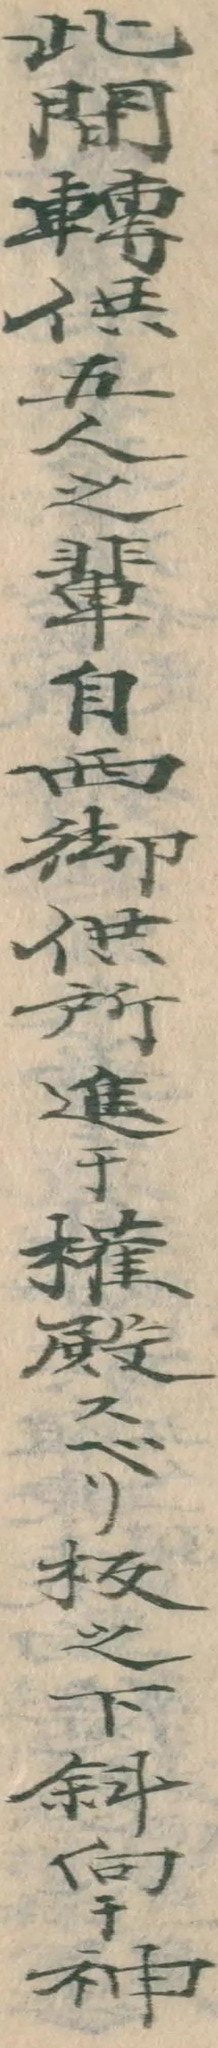此間転供五人之輩自西御供所進于権殿スベリ板之下斜向于神
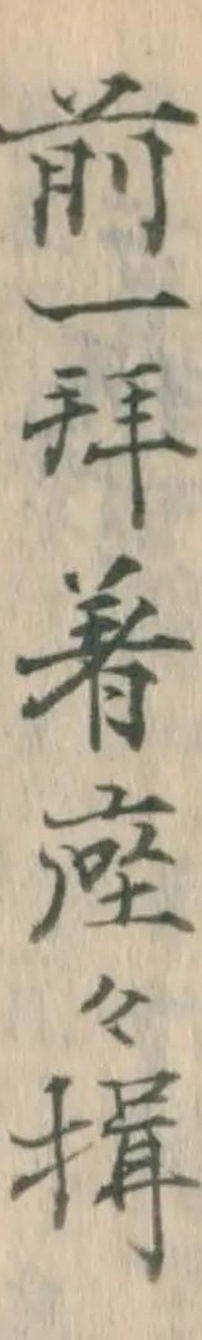前一拜着座々揖

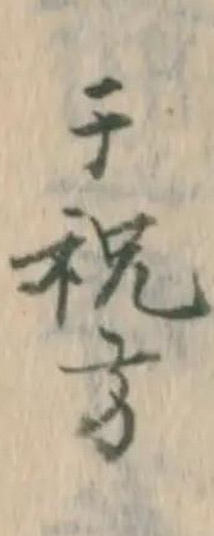于祝方
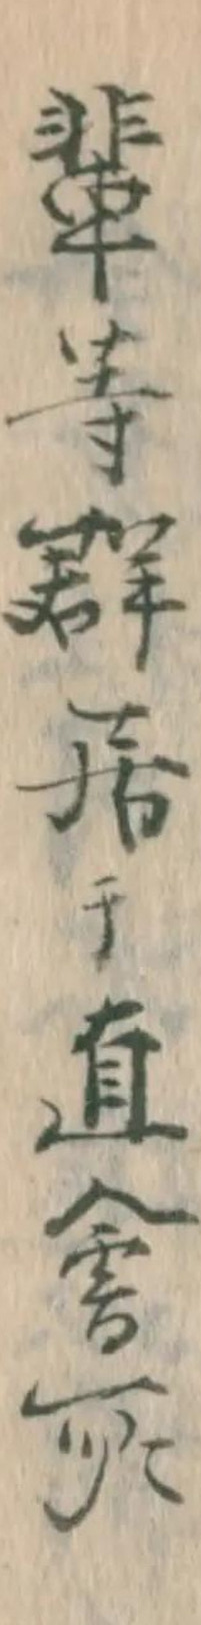輩等群居于直会所
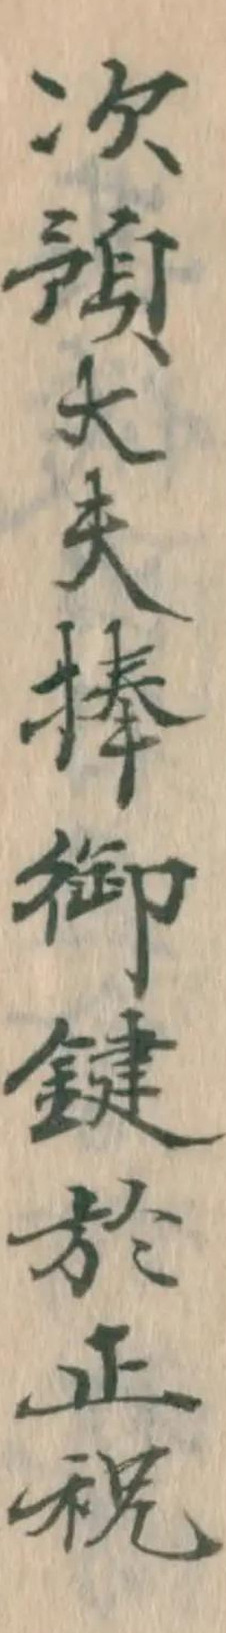次預大夫捧御鍵於正税
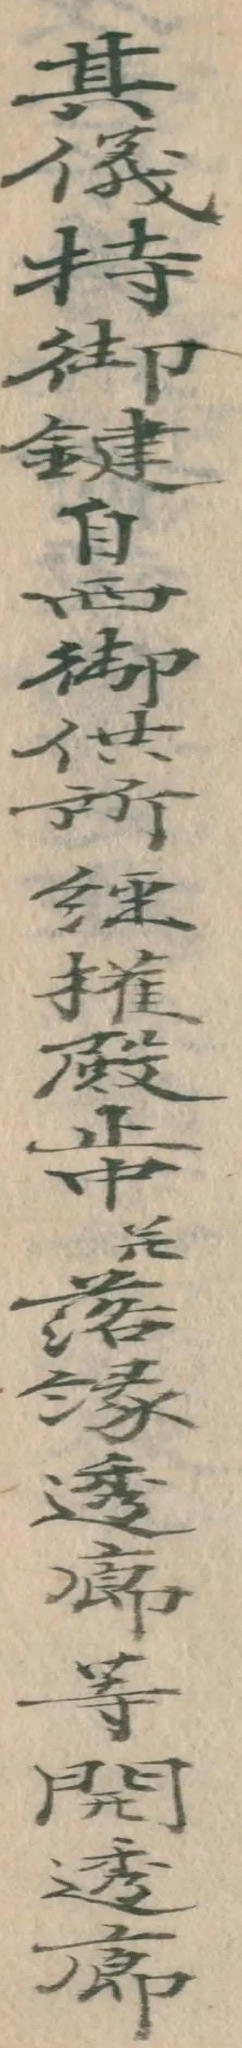其儀持御鍵自西御供所経権殿止中并落縁透廊等開透廊
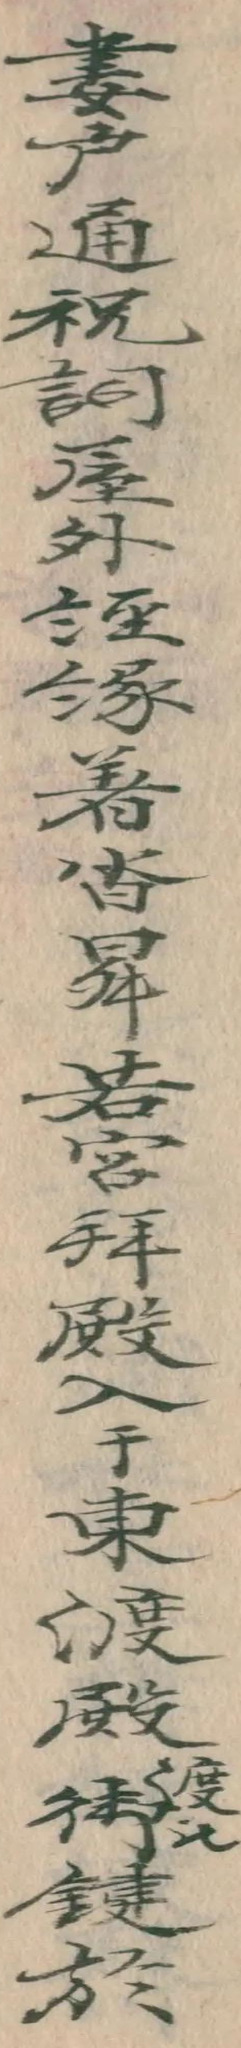妻戸通祝詞屋外経縁着沓昇若宮拜殿入于東渡殿御鍵於
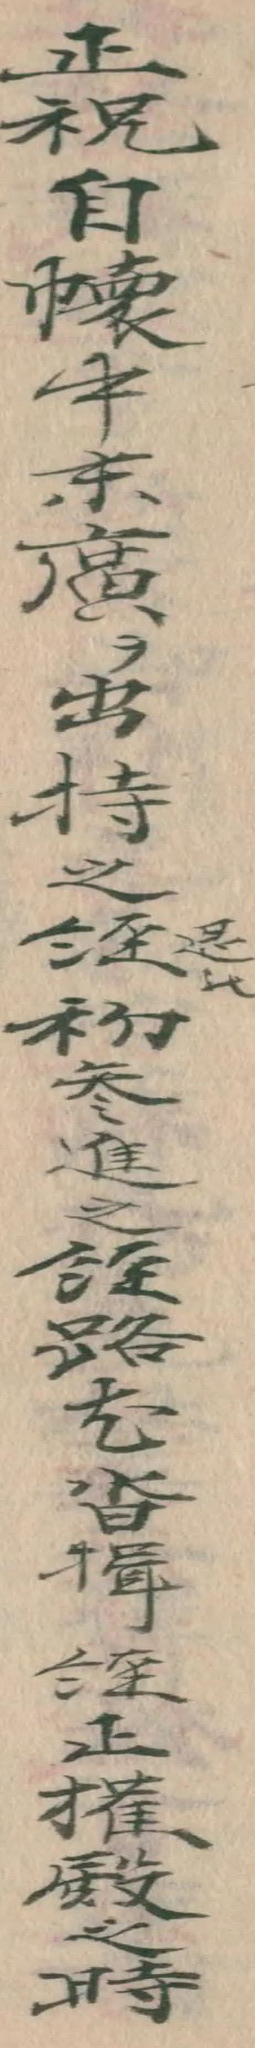正祝自懐中末広ヲ出持之経初参進之経路尤沓揖経正権殿之時
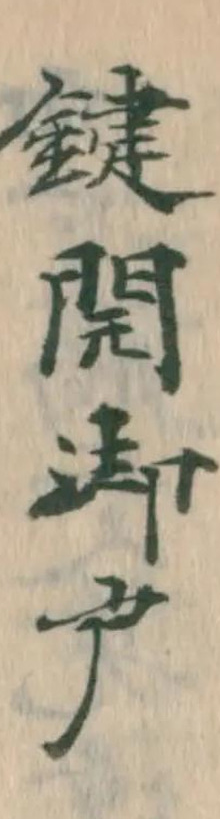鍵開御戸
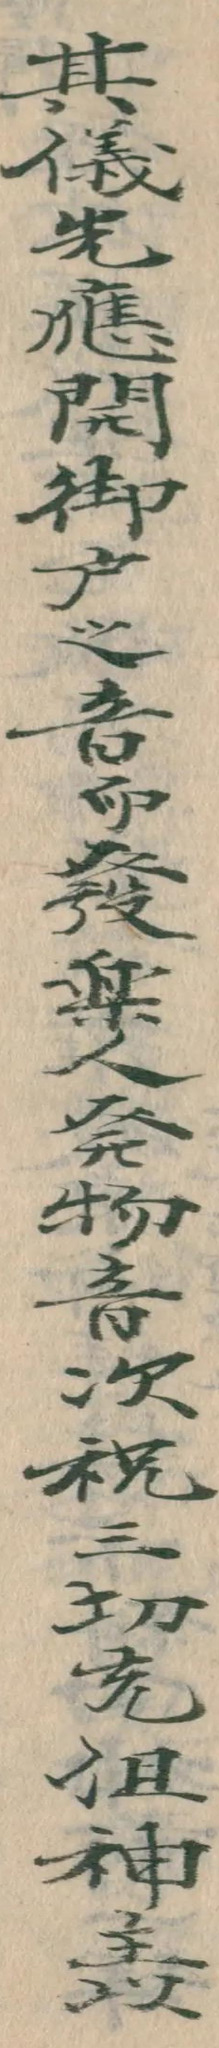其儀先応開御戸之音而発楽人発物音次祝三切充但神主以
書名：賀茂社記録. 第9冊
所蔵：国立国会図書館 National Diet Library, JAPAN
